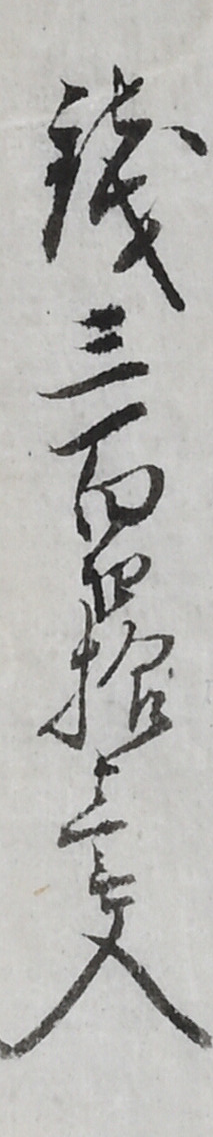銭三百四拾壱文
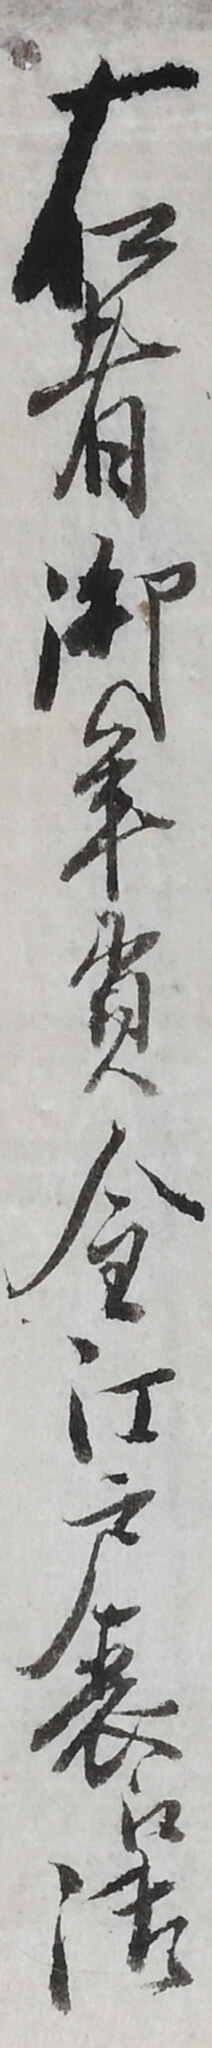右は御年貢金江戸表江御
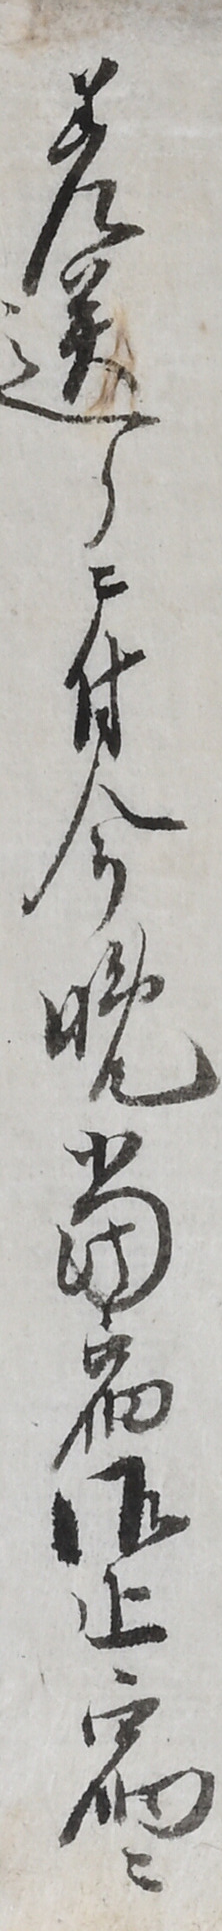差送りニ付今晩当宿御止宿ニ
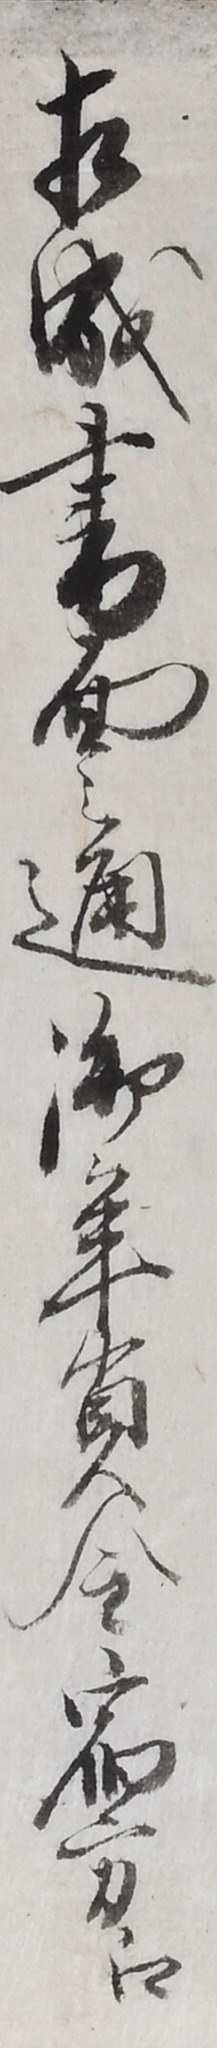相成書面之通御年貢金宿方江
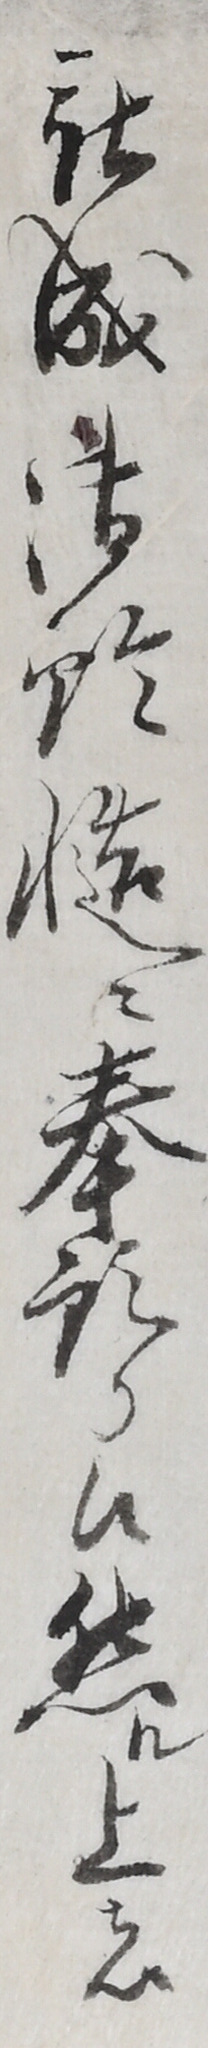被成御預慥ニ奉預り候然ル上は
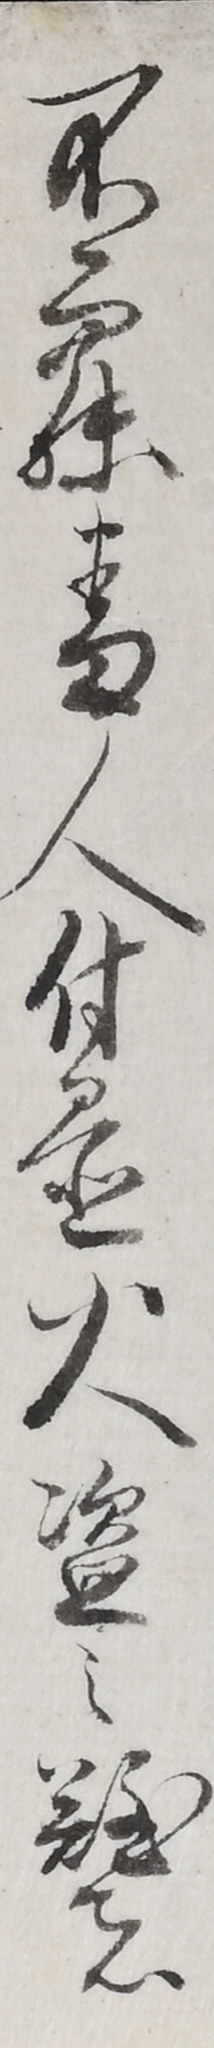不寝番人ニ付置火盗之難は
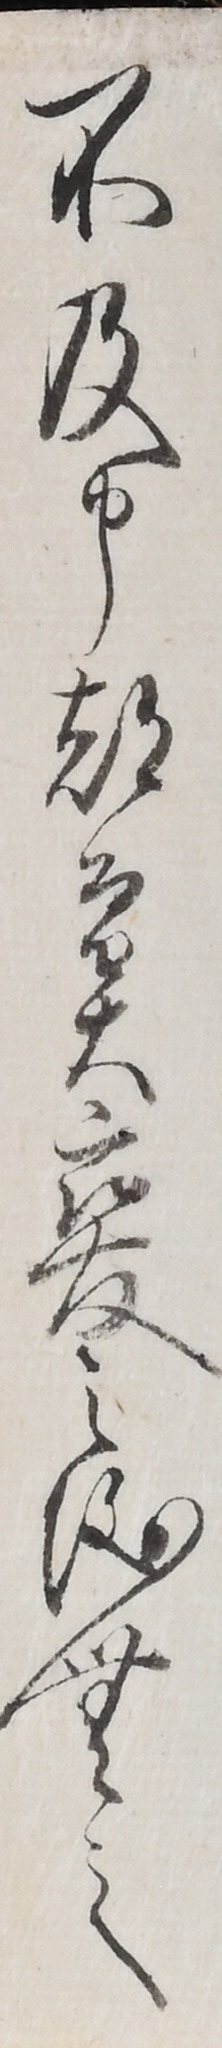不及申都て異変之儀無之
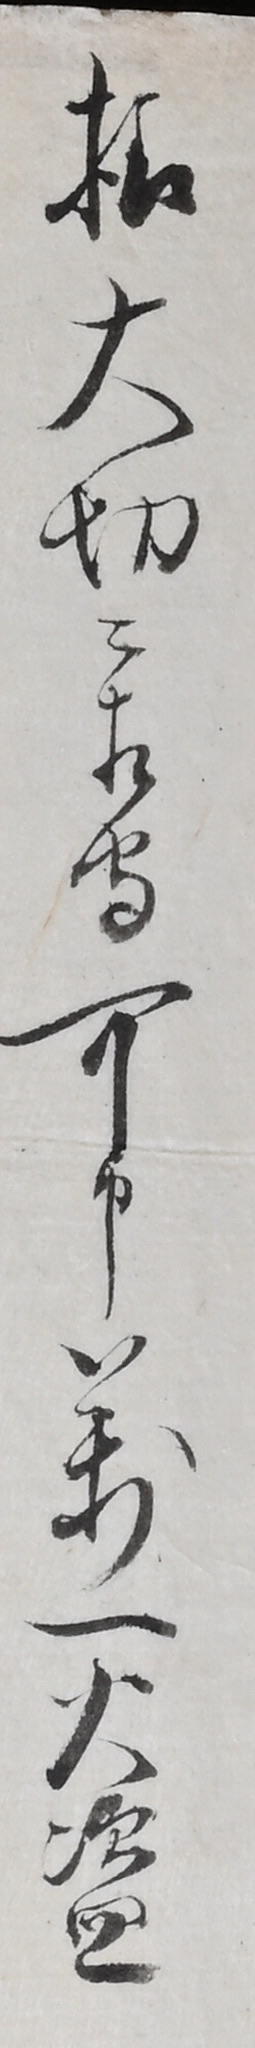様大切ニ相守可申万一火盗
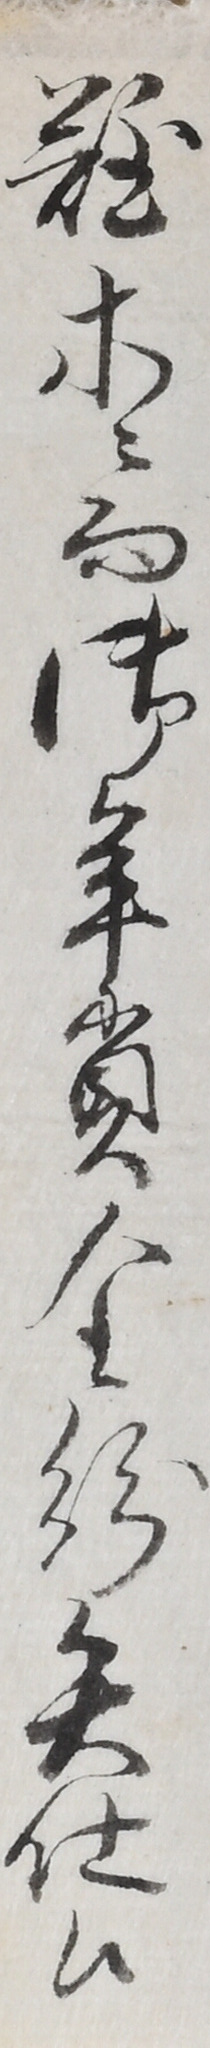難等ニ而御年貢金紛失仕候
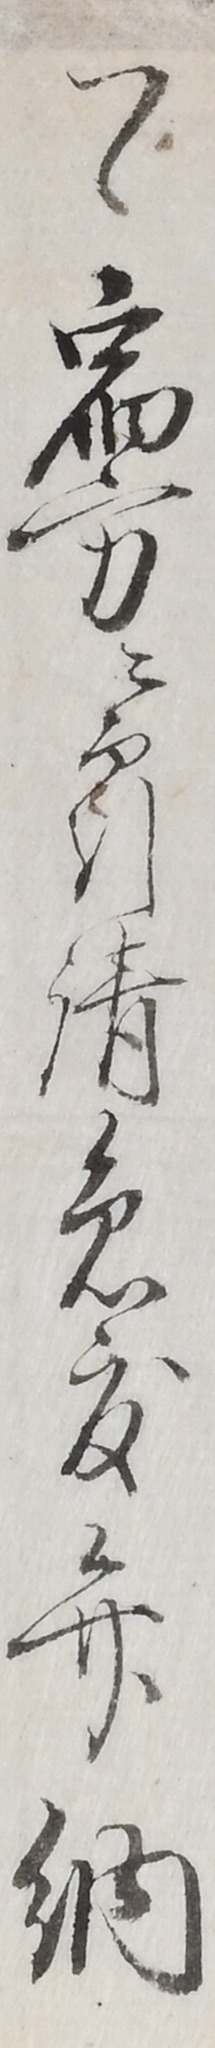ハヽ宿方ニ而引請急度弁納
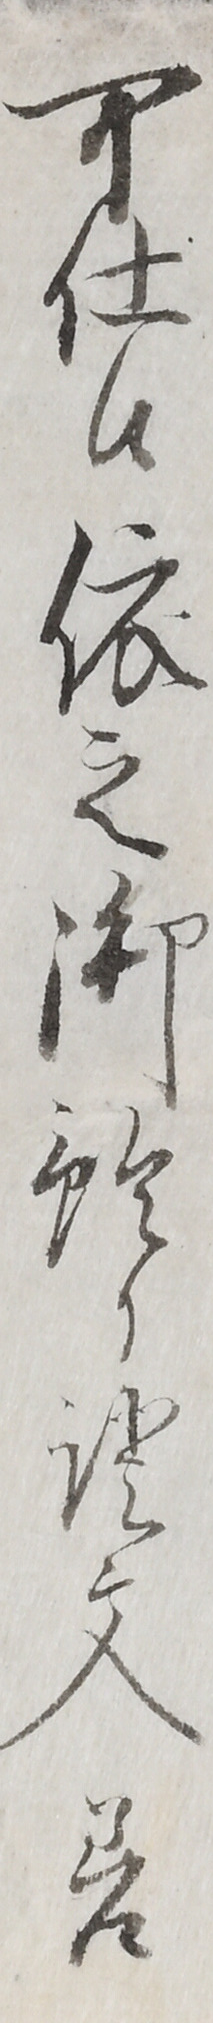可仕候依之御預り證文差
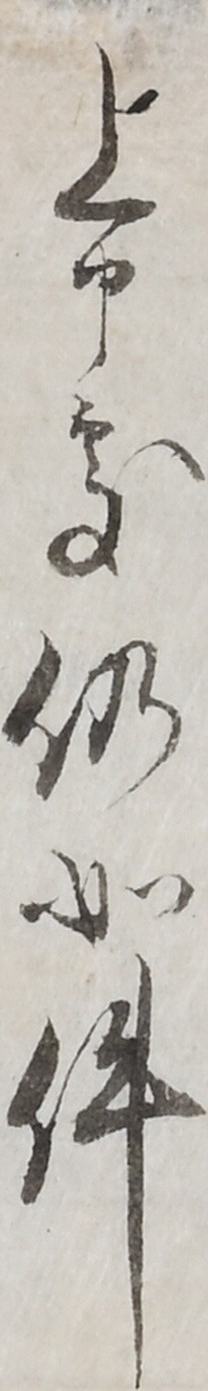上申処仍如件
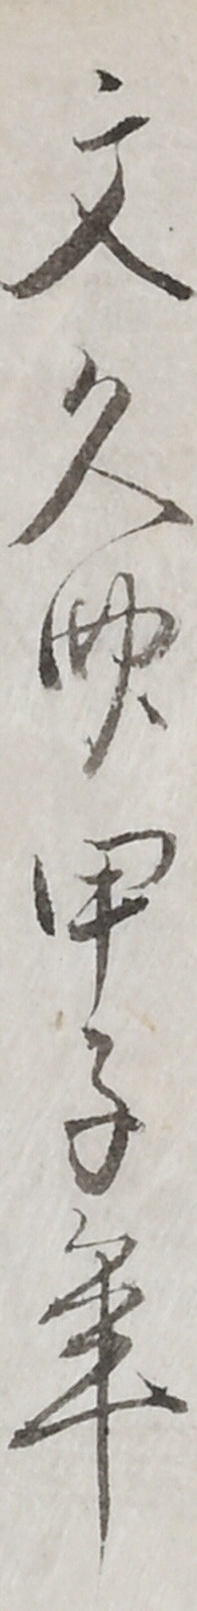文久四甲子年
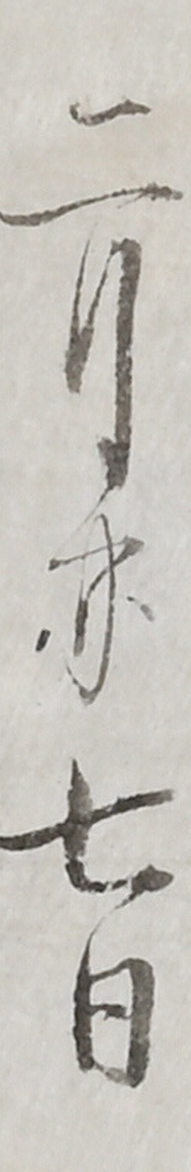二月廿七日
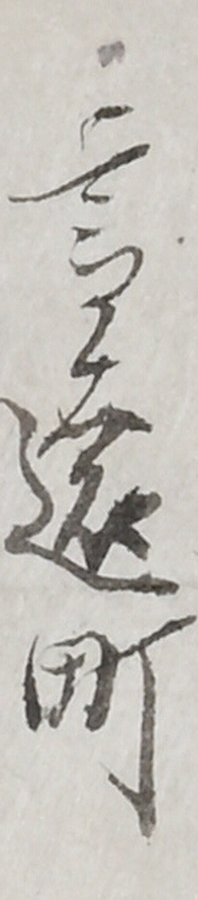高遠町
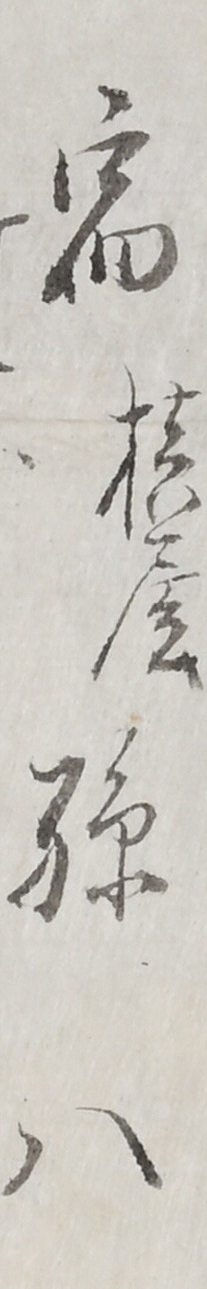宿槙屋孫八
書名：年内行事帳
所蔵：伊那市立高遠町図書館・合同会社AMANE
